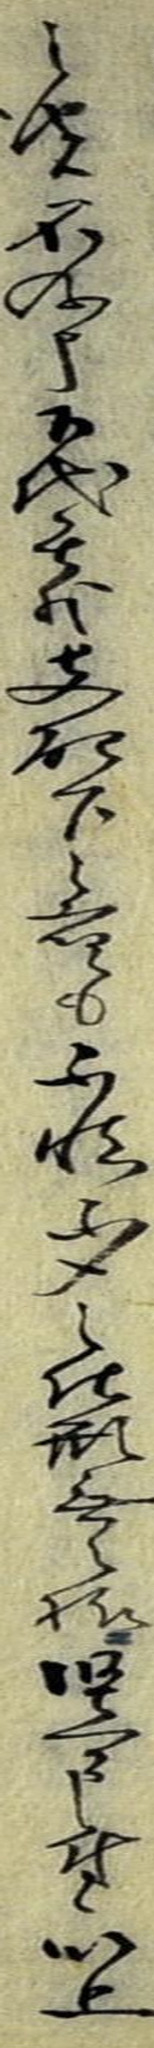之儀ハ不及申下代其外支配下之者へも不慎不〆之仕形無之様ニ堅可申付候以上
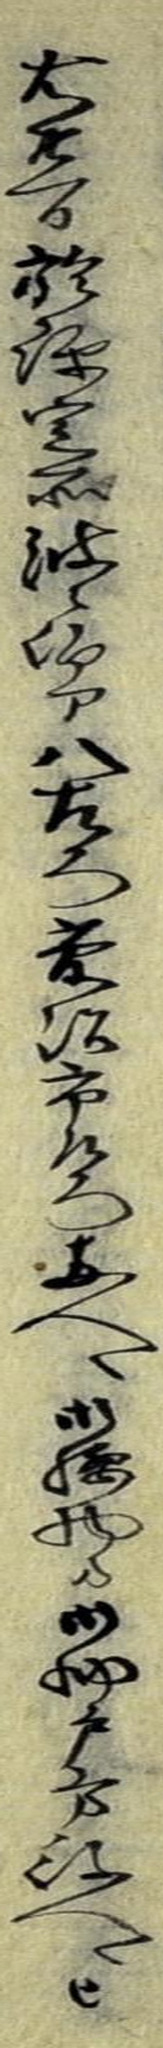右廿一日於評定所波々伯部八左衛門菅沼市左衛門両人へ御腰物方御納戸方役人へ被
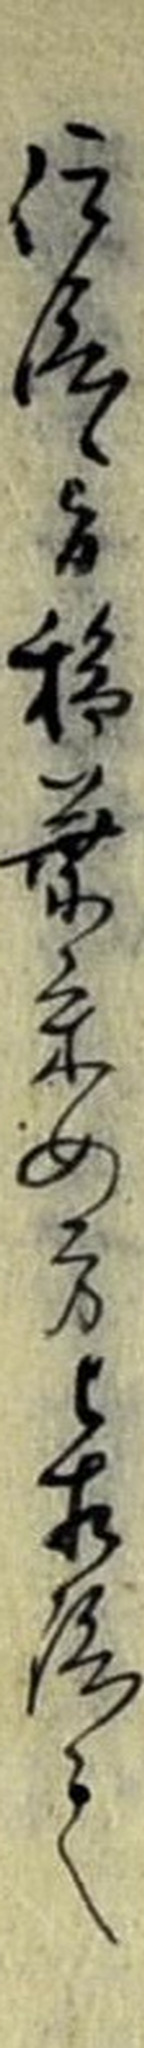仰渡候旨稲葉采女方被相渡之
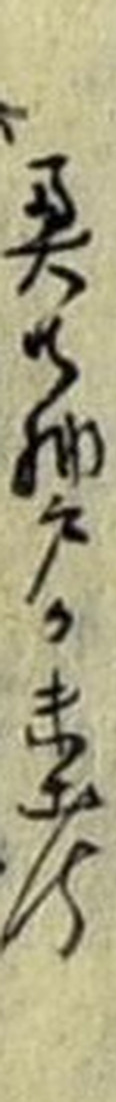―奥御納戸か未考
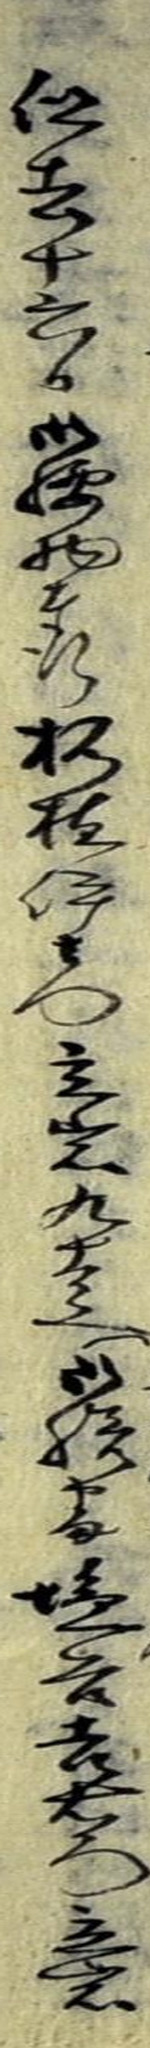但去十六日御腰物奉行柘植伊右衛門立岩九大夫御膳番塩谷吉右衛門立岩
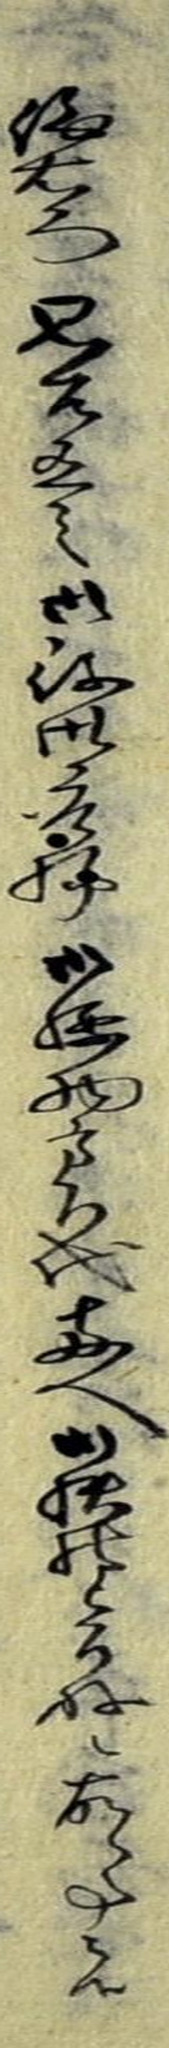儀右衛門思召有之御役御取揚御腰物方下代両人御扶持被召放候故之事ニ候

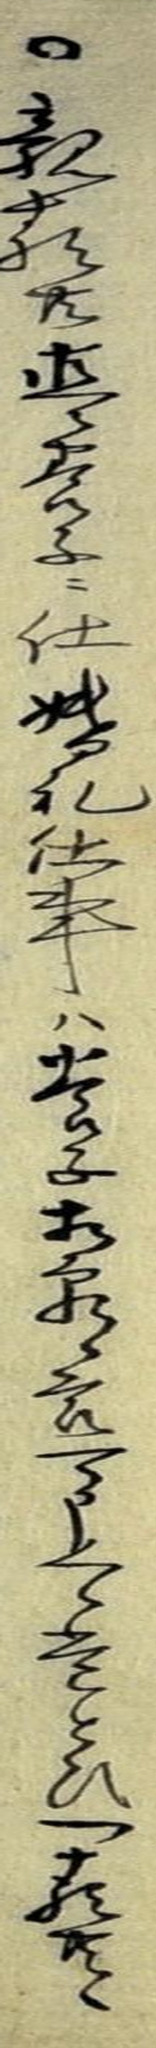〇親類共直ニ養子ニ仕婚礼仕事ハ養子相願候節可申上候たとひ一類共へ
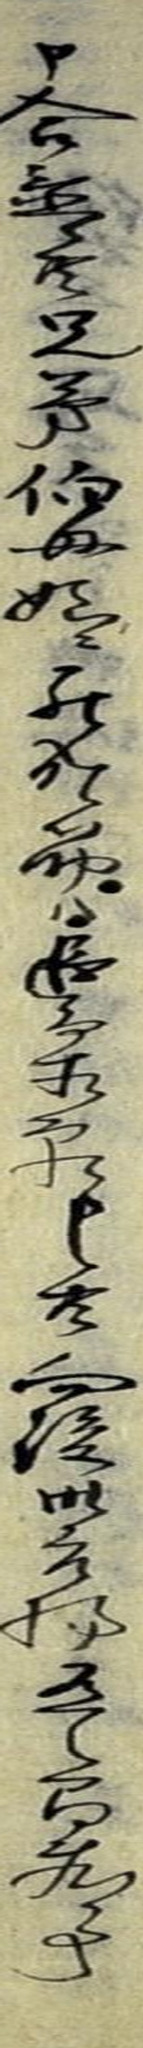申合置候共兄弟伯母姪ニ罷成候筋ハ追而相願申共向後御取揚有之間敷事
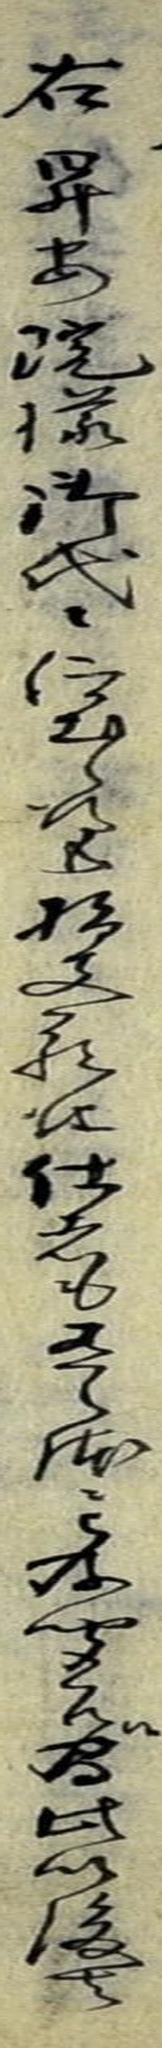右昇安院様御代被仰出候得共指支難儀仕者も有之体ニ被及聞召候間此以後者
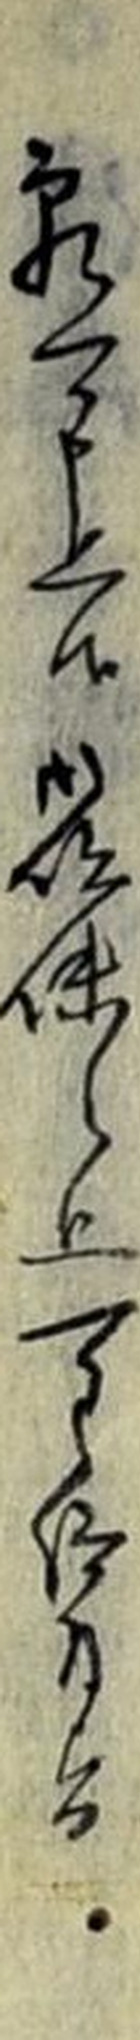願可申上候御吟味之上可被仰付旨
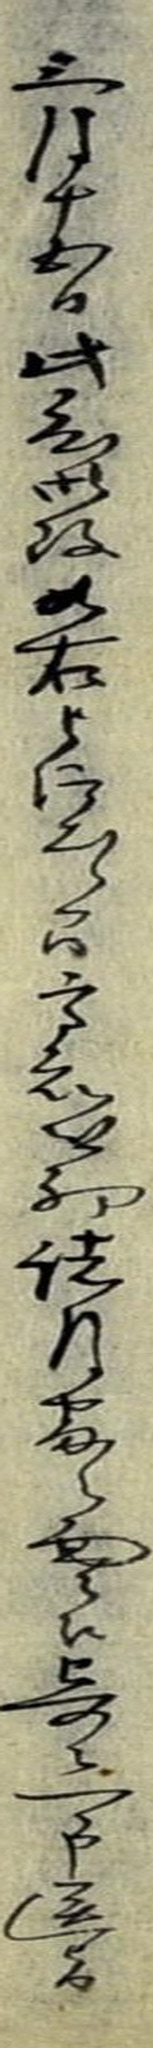三月十五日此度御改如右被仰出候間高知を初諸月番之面々江寄々申送旨
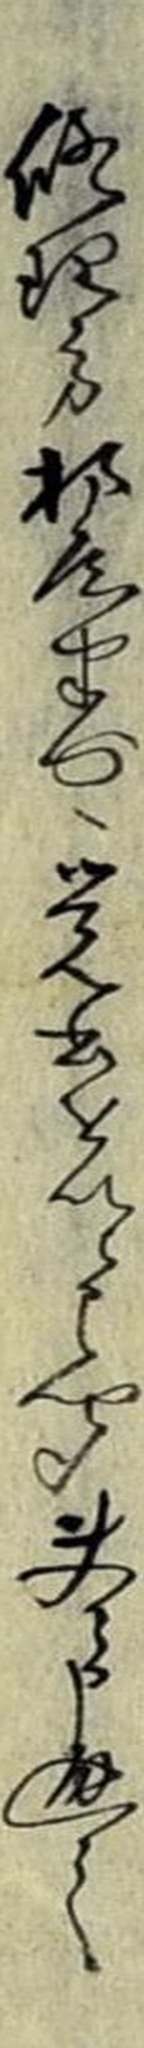修理方栃屋半右衛門へ覚書を以被申聞夫々申通之
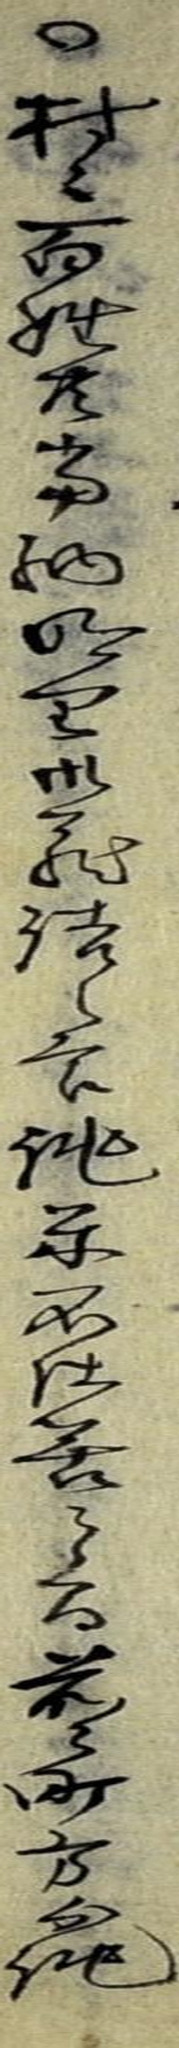〇村々百姓共当納明里御蔵詰之節詐米不仕筈ニ候間前々町方ゟ詐
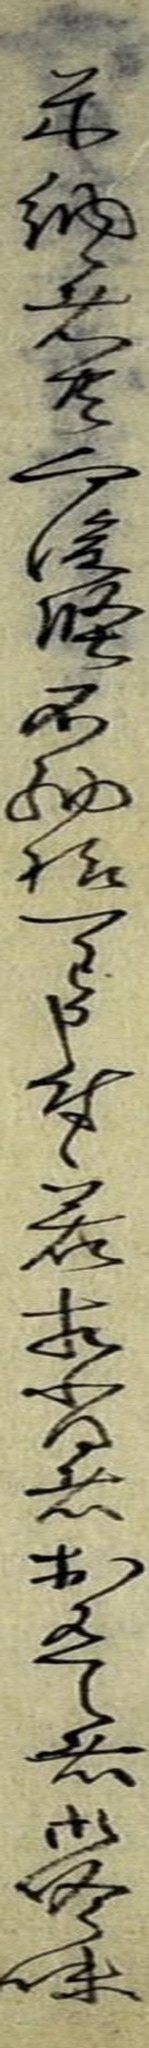米納候者共向後堅不納様可被申付候若相背者於有之者御吟味
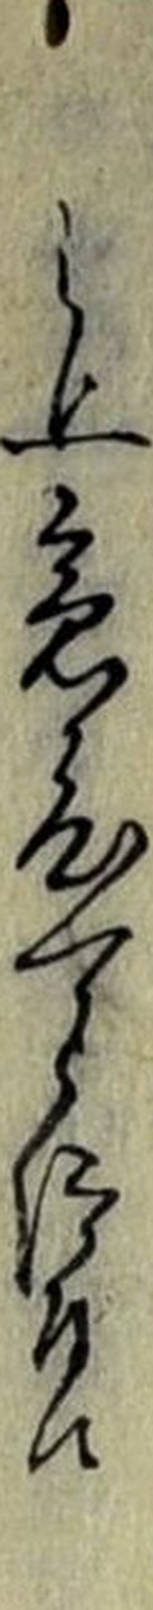之上急度可被仰付候
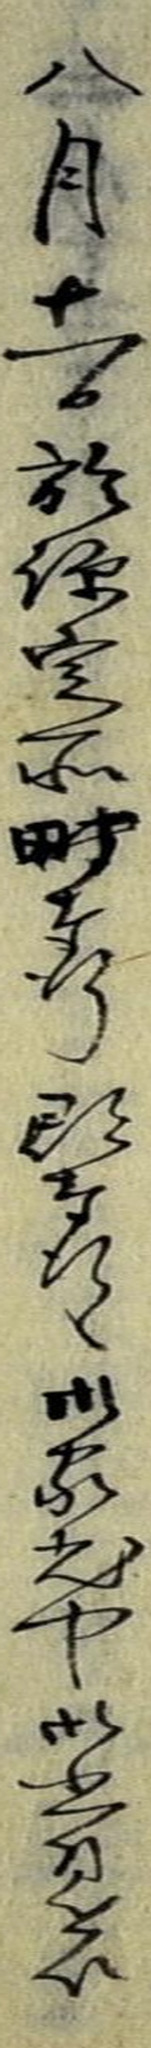八月十一日於評定所町奉行郡奉行へ御家老中御書付を以
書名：命令之部 一
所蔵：福井県文書館 Fukui Prefectural Archives
